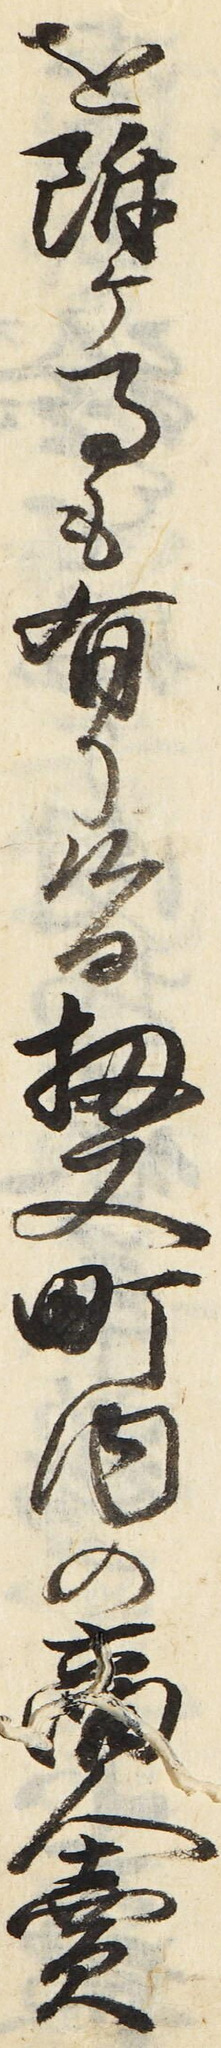を附けるも有りける扨又町内商人売
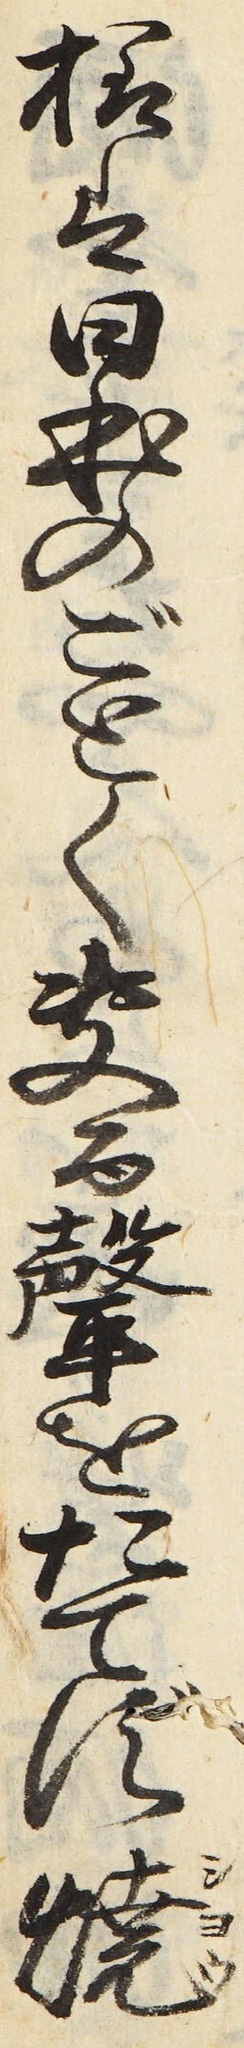様は日本のごとく決而声たてず焼

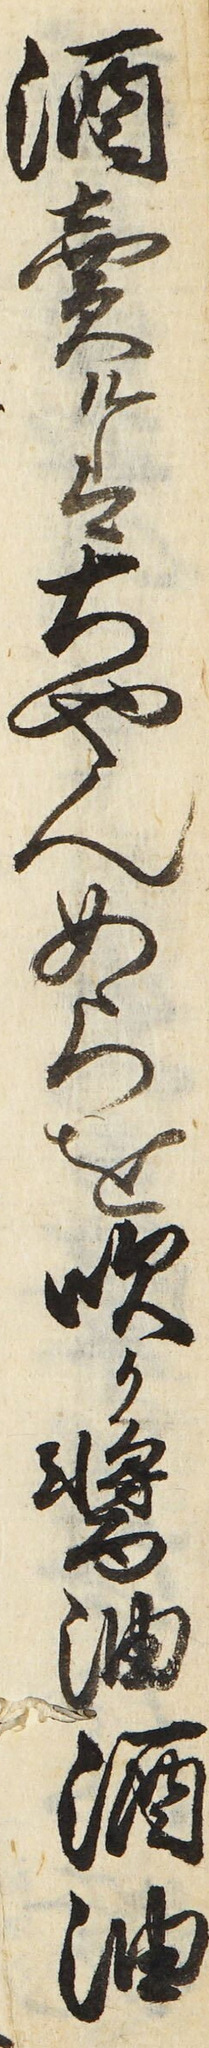酒売るはちやんめらを吹く醤油酒油
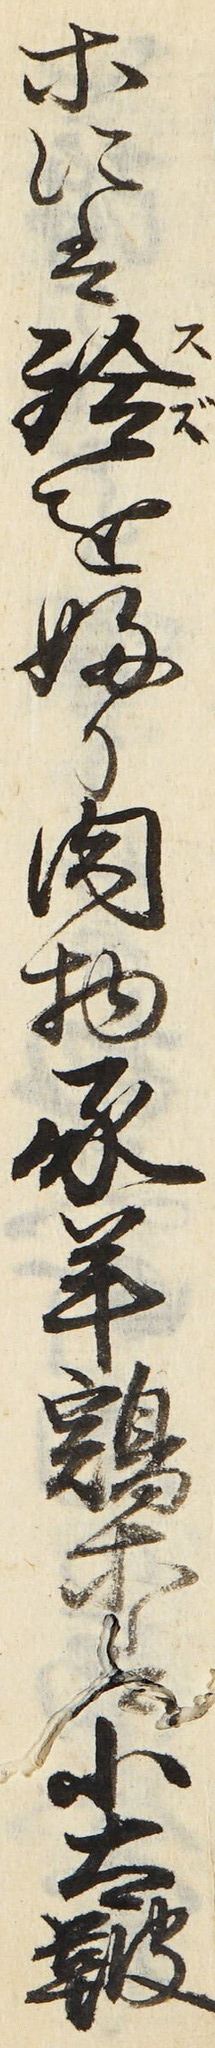等には鈴をふり肉物豕羊鶏等は小太鼓
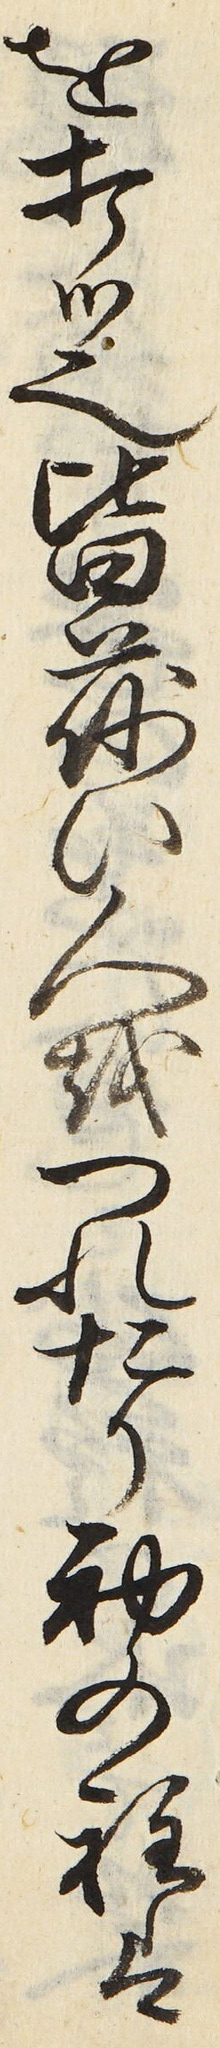を打つ也皆荷ひ人をつれたり初の程は
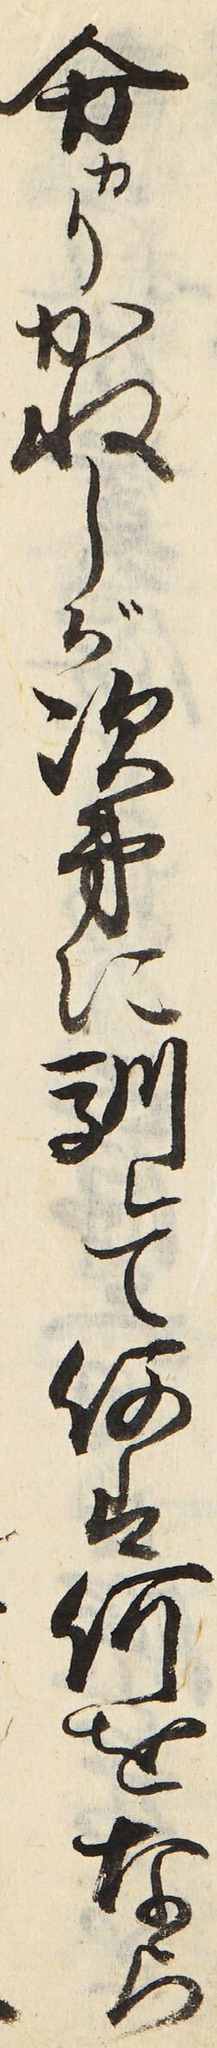分かりかねしが次第に馴れて何は何をなら
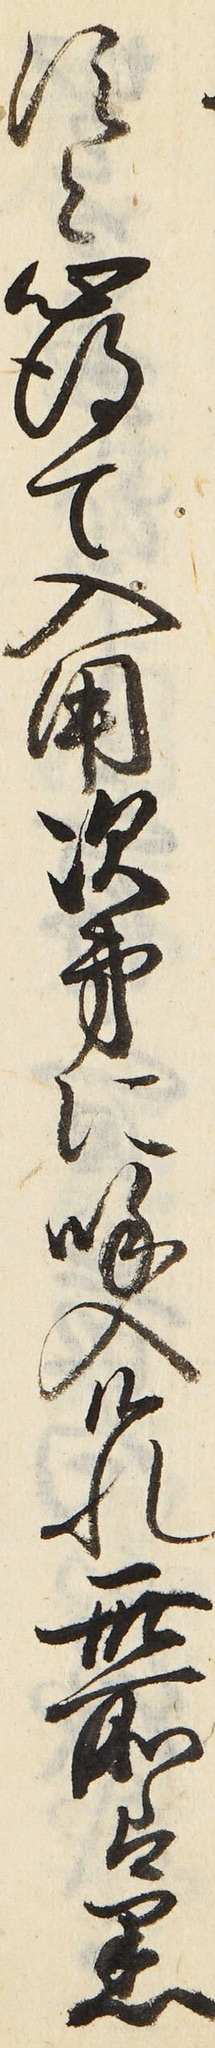すと心得て入用次第に呼入けれ此所は黒
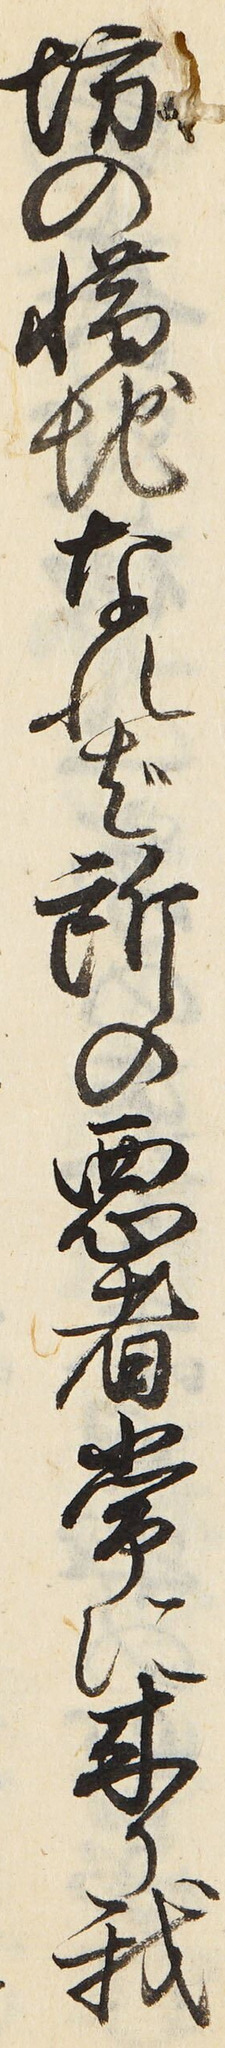坊の借地なれば所の悪者常に来り我
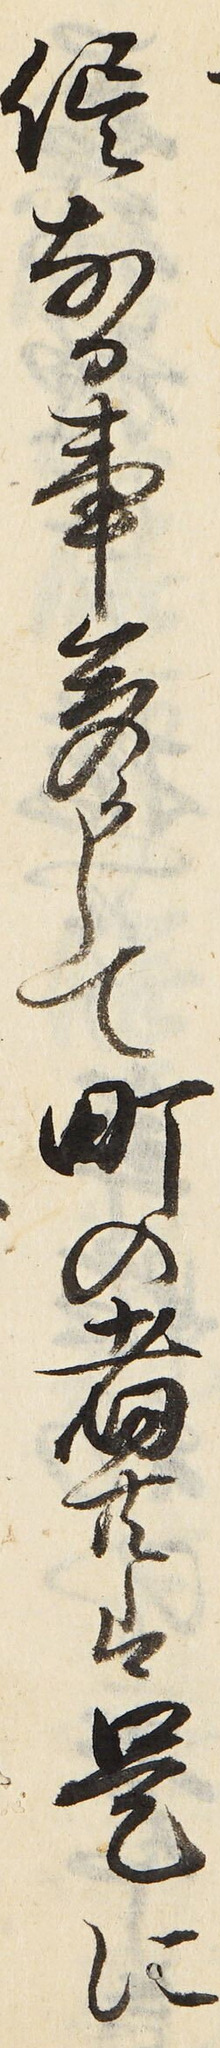侭なる事多くして町の者共は是に
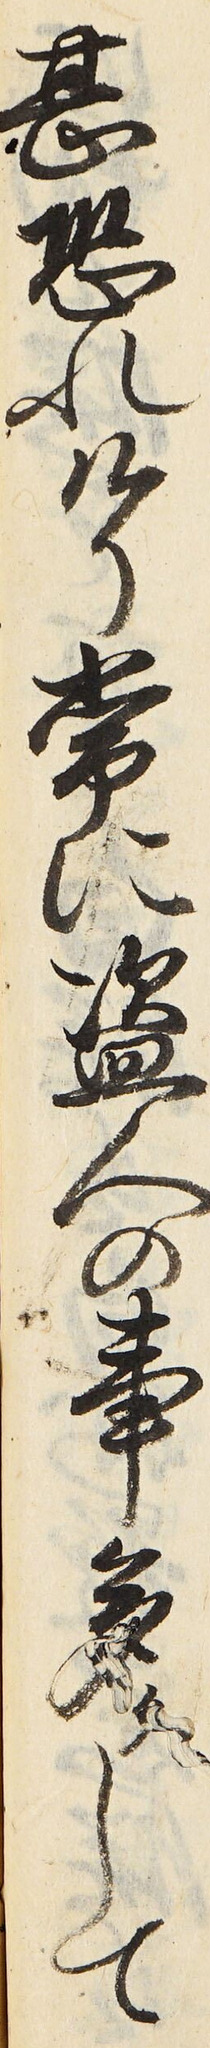甚恐れけり常に盗人の事多くして
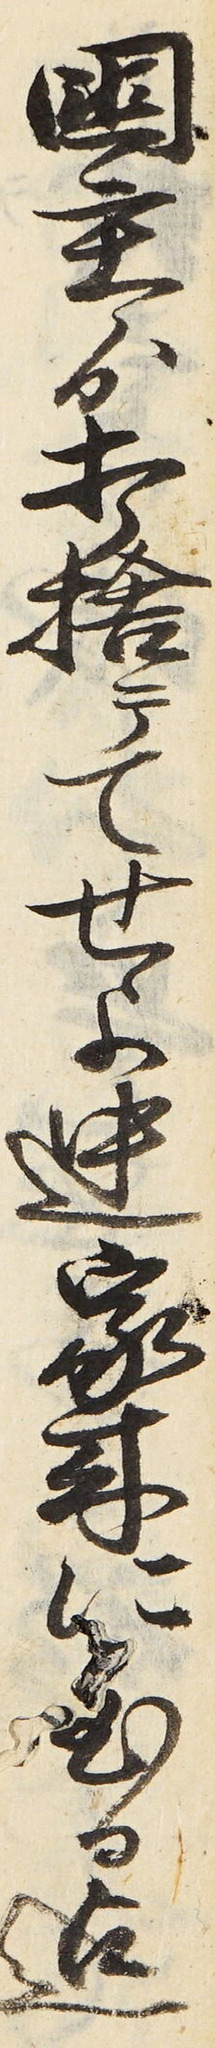国主ゟ打捨ててせよ迚家来に至る迠
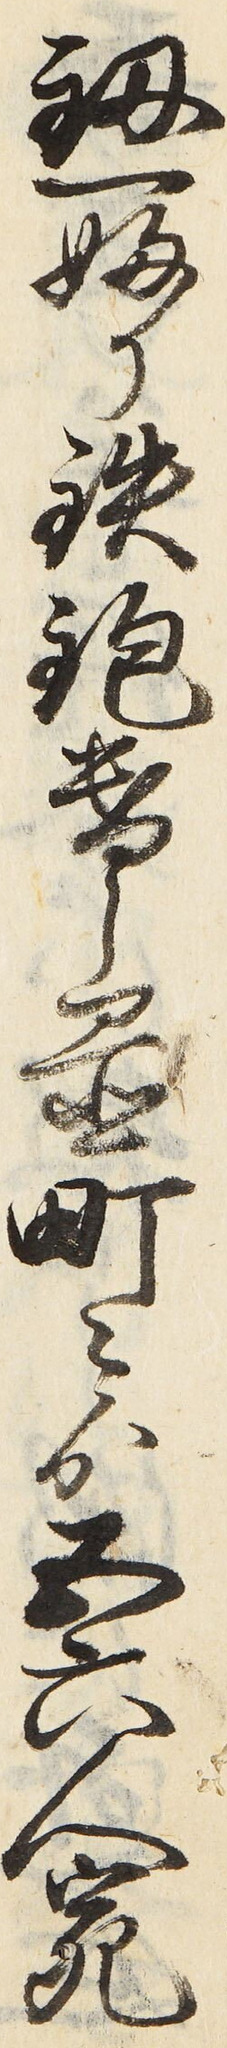釼一ふり鉄砲替し置町々ゟ五六人宛
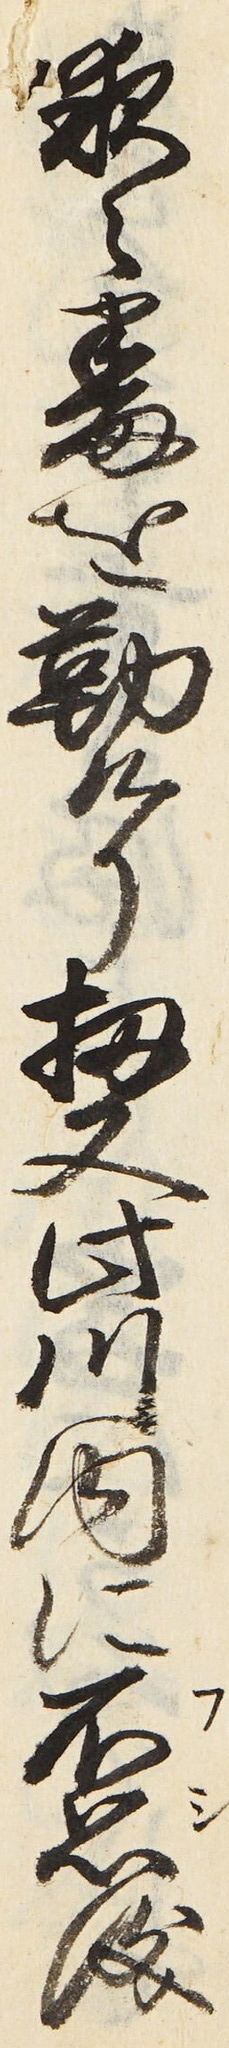夜々番を勤けり扨又此川内に不思儀
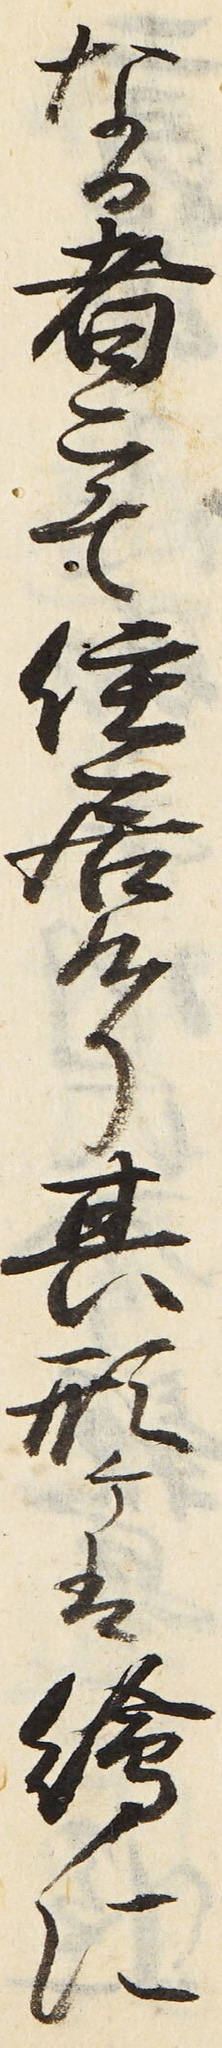なる者こそ住居けり其形ちは絵に
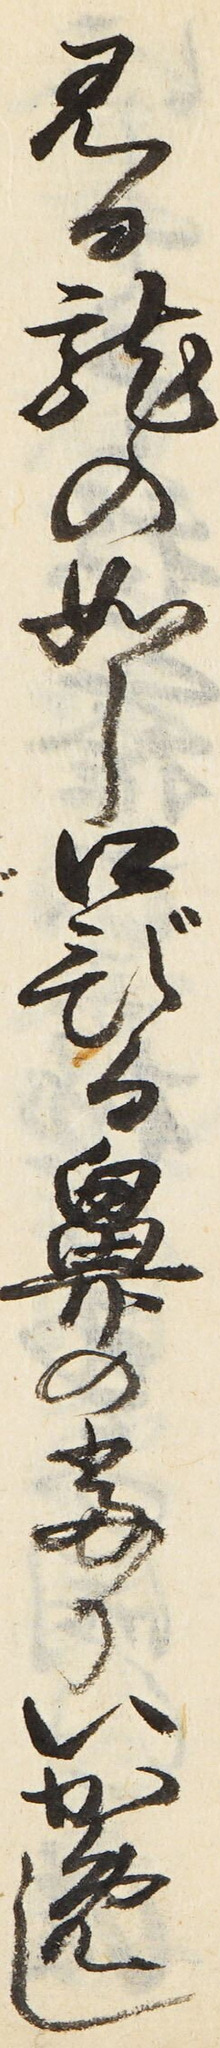見る龍の如し口びる鼻の当りいかめし
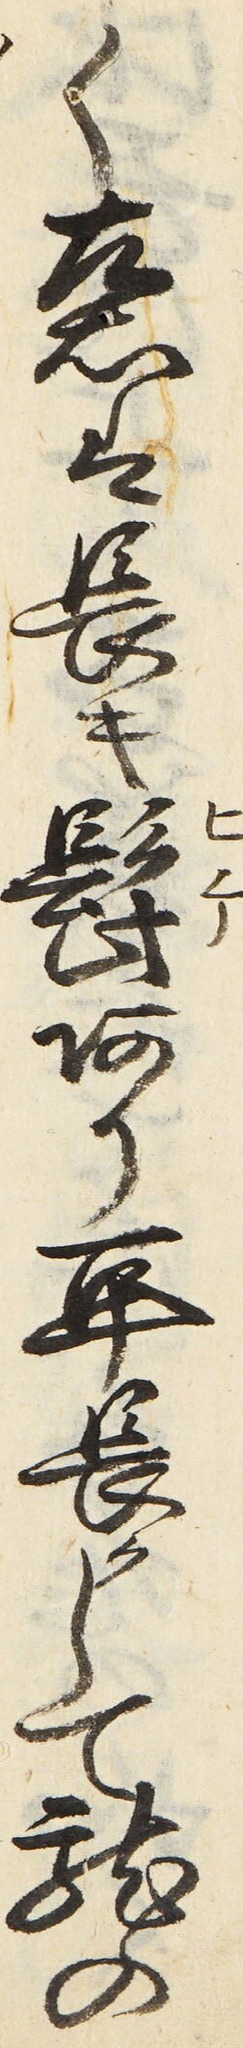く左右は長き髭あり耳長くして龍の
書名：華夷九年録
